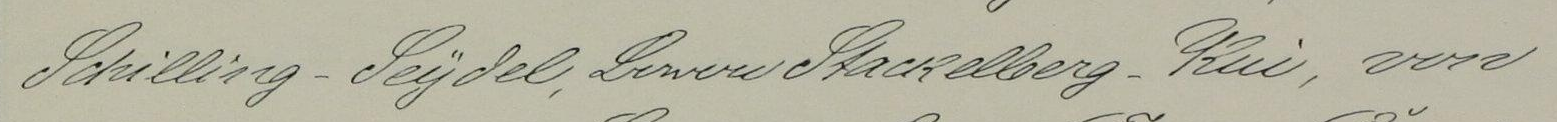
Schilling-Seydel, Baron Stackelberg-Kui, von
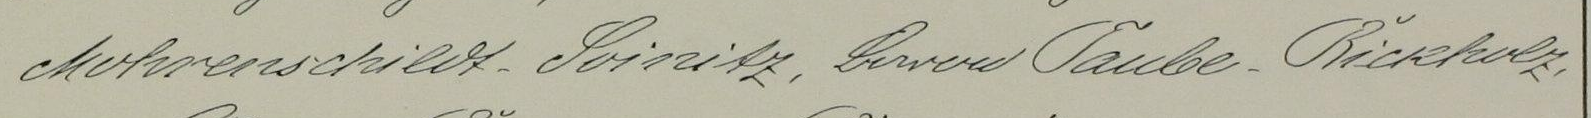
Mohrenschildt-Soinitz, Baron Taube-Rickholz,
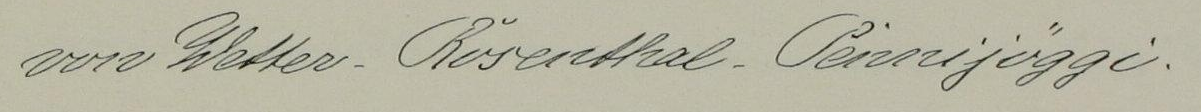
von Wetter-Rosenthal-Pennijöggi.
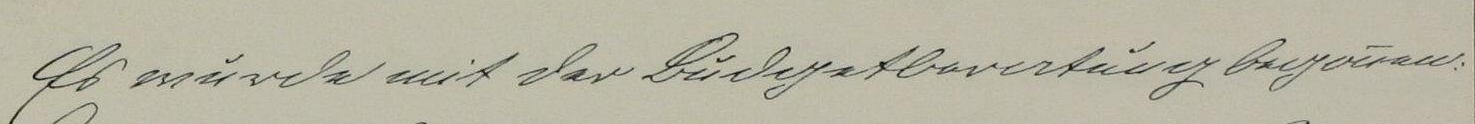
Es wurde mit der Budgetberatung begonnen:
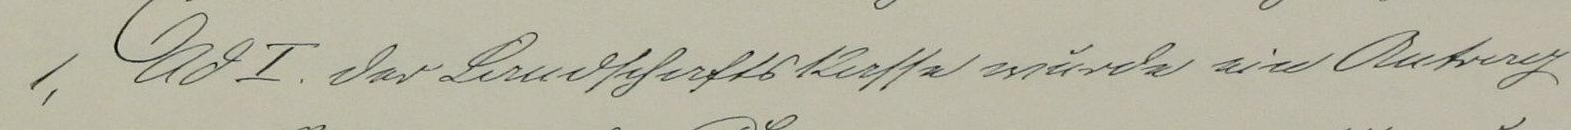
1. Ad I. der Landschaftskasse wurde ein Antrag
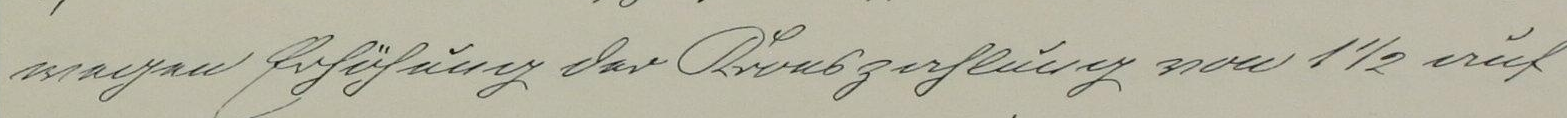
wegen Erhöhung der Kronszahlung von 1½ auf
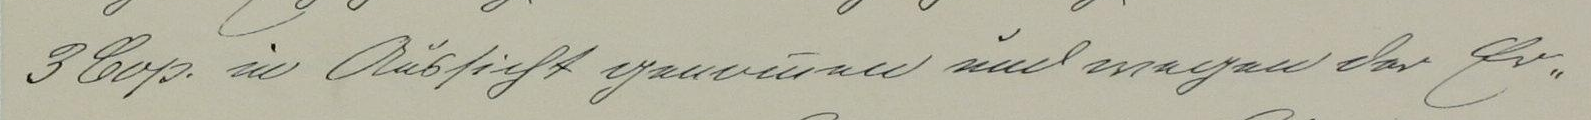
3 Cop. in Aussicht genommen und wegen der Er-
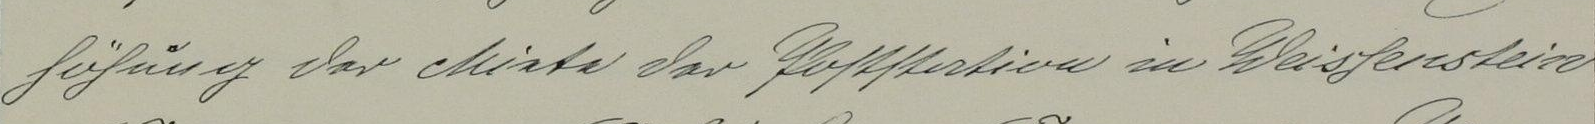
höhung der Miete der Poststation in Weissenstein
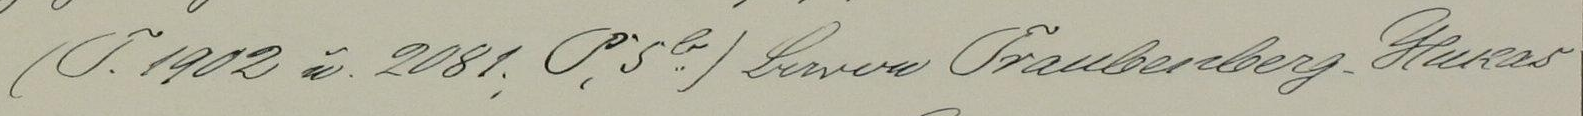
(T.1902 u. 2081; P.5b) Baron Traubenberg-Hukas
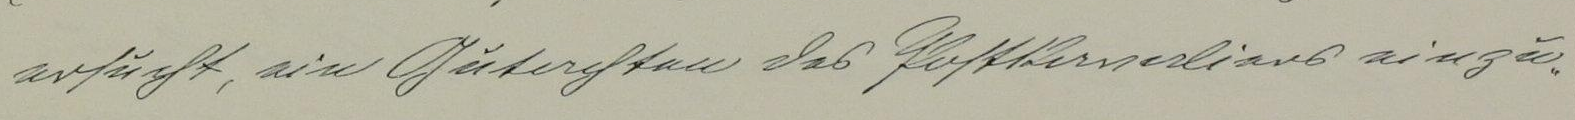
ersucht, ein Gutachten des Postkavaliers einzu-
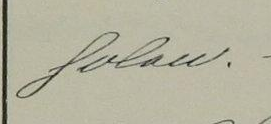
holen.
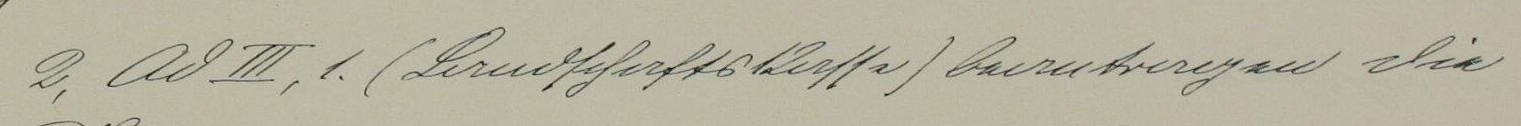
2. Ad III,1. (Landschaftskasse) beantragen die
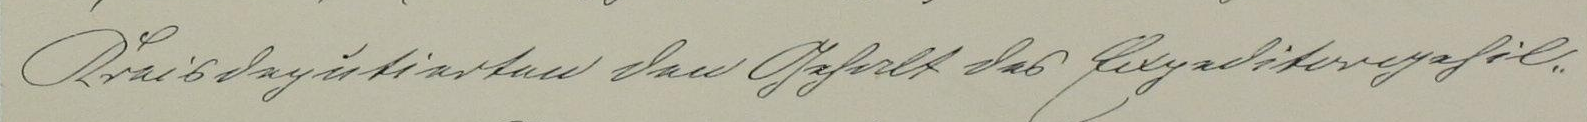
Kreisdeputierten, den Gehalt des Expeditorgehil-
